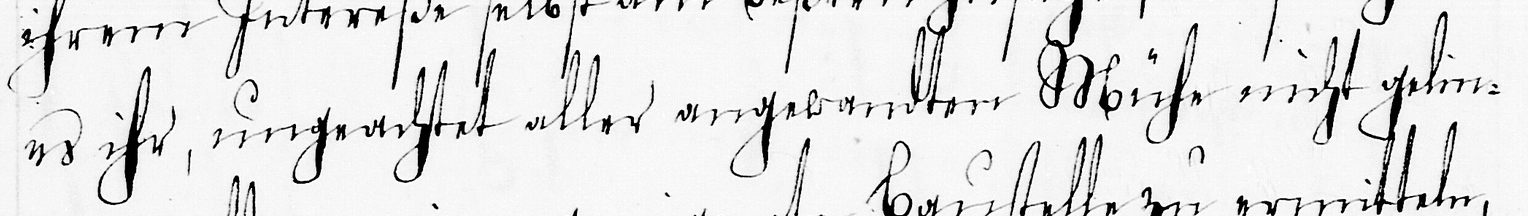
es ihr, ungeachtet aller angewandten Mühe nicht gelin¬
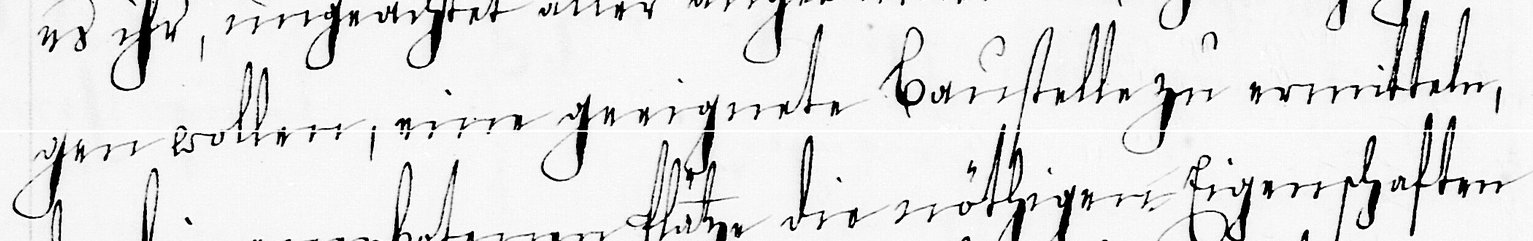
gen wollen, eine geeignete Baustelle zu ermitteln,
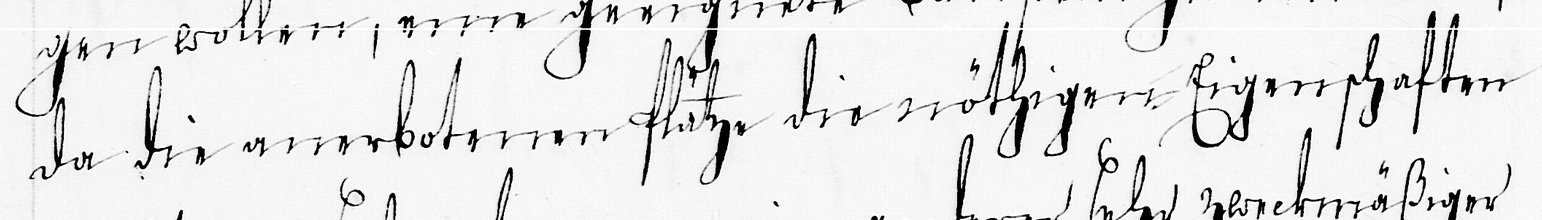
da die anerbotenen Plätze die nöthigen Eigenschaften
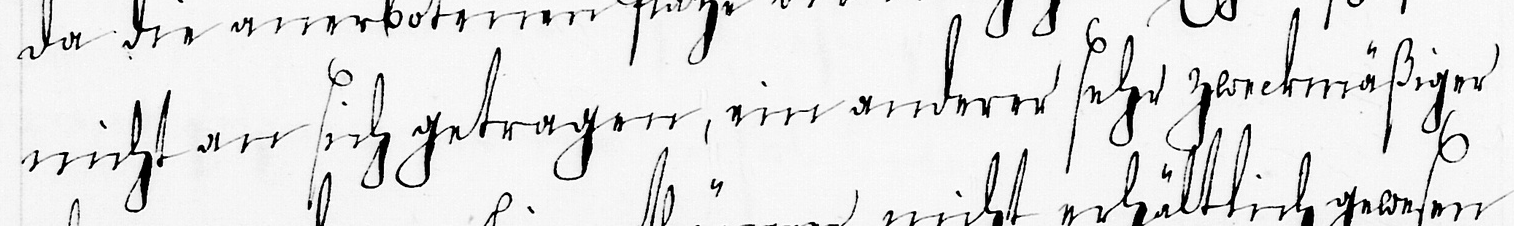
nicht an sich getragen, ein anderer sehr zweckmäßiger
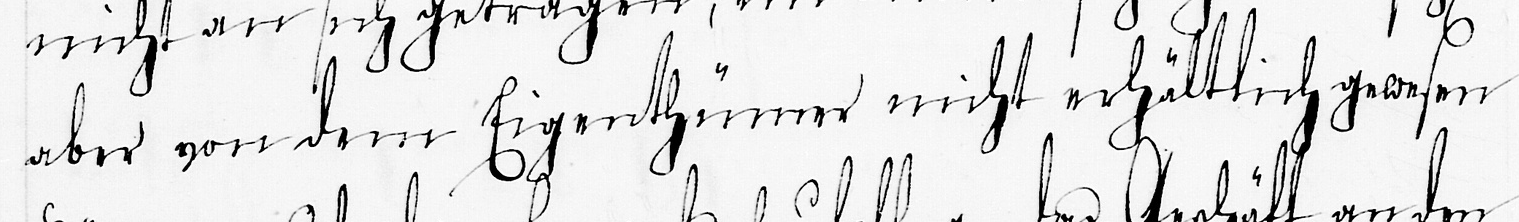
aber von dem Eigenthümer nicht erhältlich gewesen
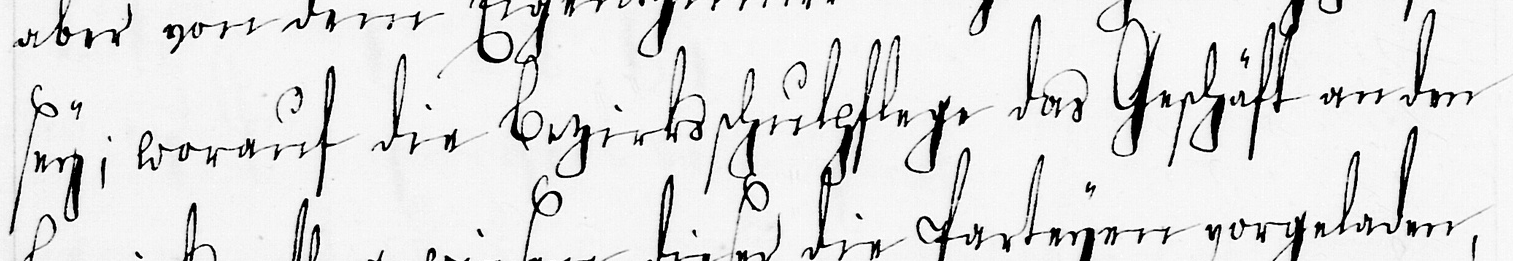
sey; worauf die Bezirksschulpflege das Geschäft an den
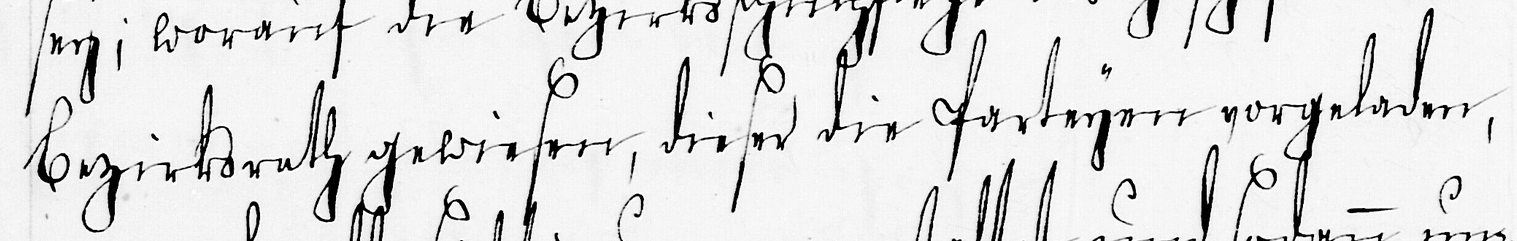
Bezirksrath gewiesen, dieser die Parteyen vorgeladen,
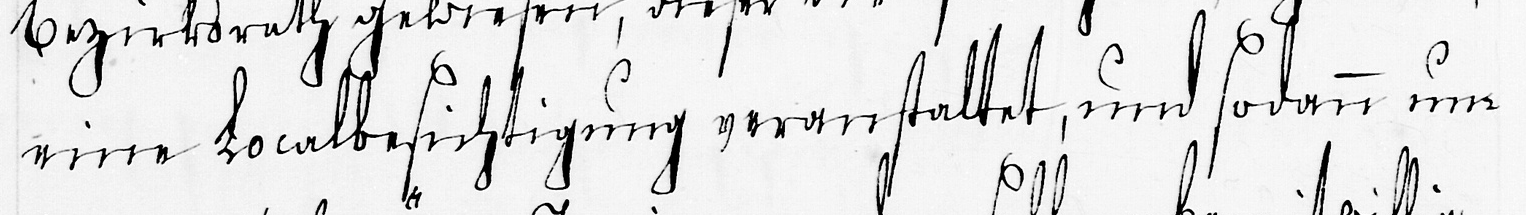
eine Localbesichtigung veranstaltet, und sodann un¬
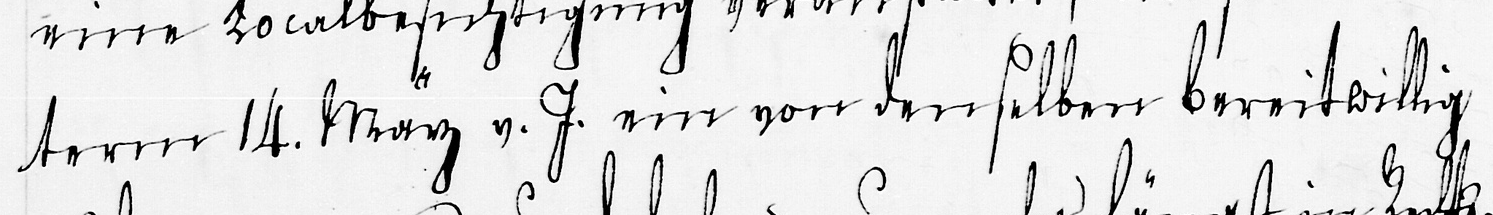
term 14. März v. J. ein von denselben bereitwillig
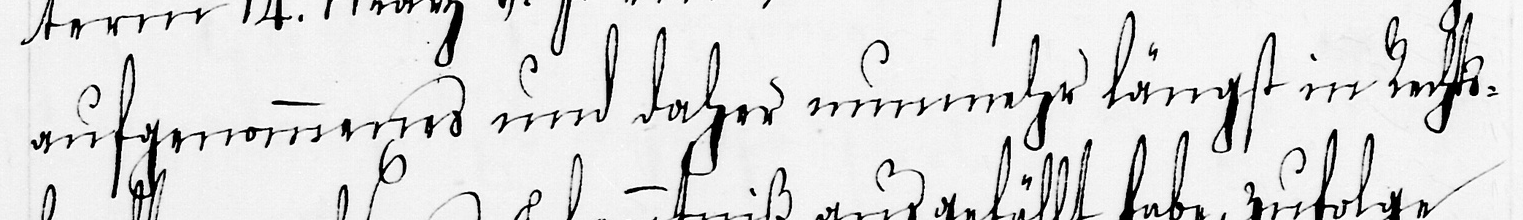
aufgenommenes und daher nunmehr längst in Recht¬
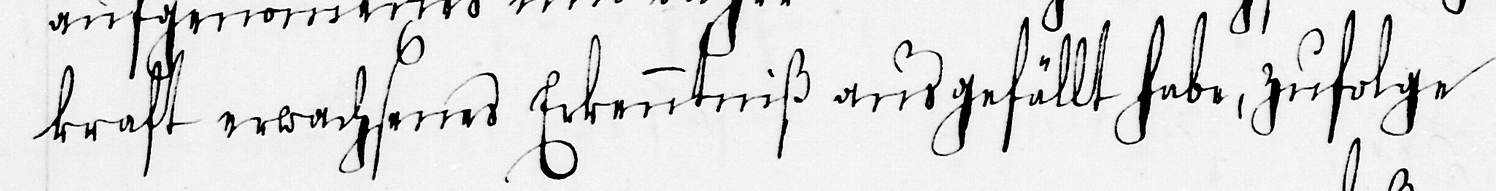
skraft erwachsenes Erkenntniß ausgefällt habe, zufolge
